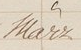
Bern
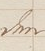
den
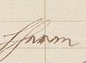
HHerrn
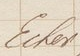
Präsident
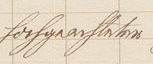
Hochgeachteter
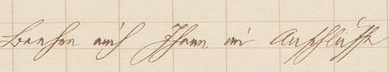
Beehre mich Ihnen im Auschlusse
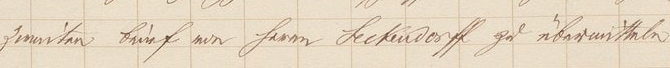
zweiten Brief von Herrn Seckendorff zu übermitteln.
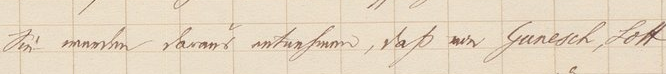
Sie werden daraus entnehmen, daß von Gunesch, Lott
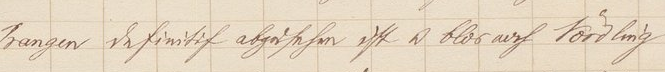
Prangen definitif abgesehen ist & blos noch Nördling
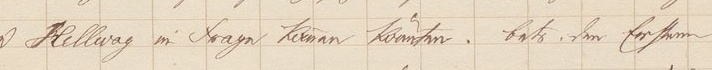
& Hellwag in Frage kommen könnten. Betr. den Erstern
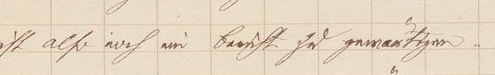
ist also noch ein Bericht zu gewärtigen.
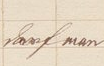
Weber wird
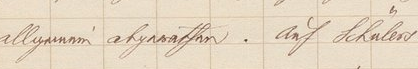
allgemein abgerathen. Auf Schülers
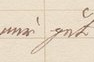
man besonders
